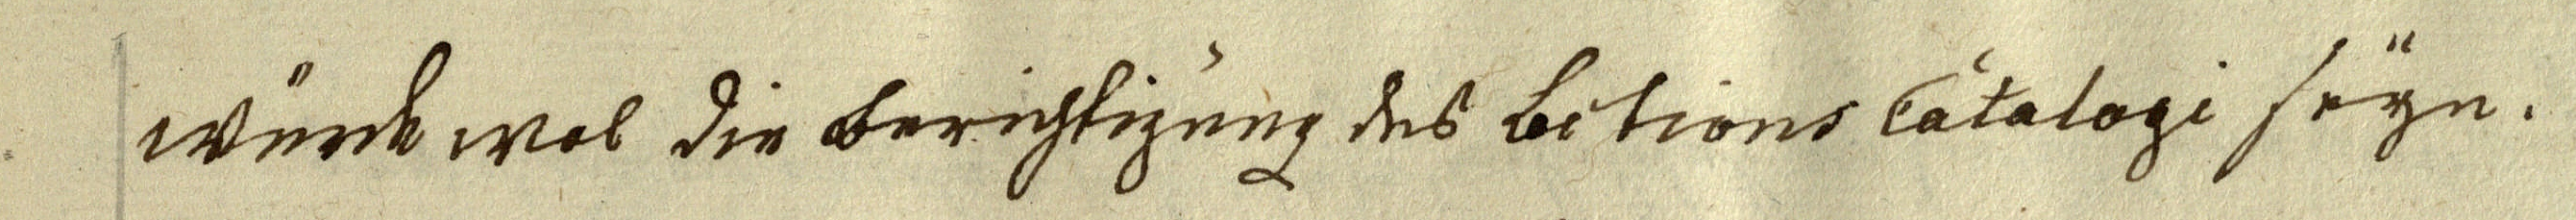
würde die Berichtigung des Lections Catalogi seÿn.
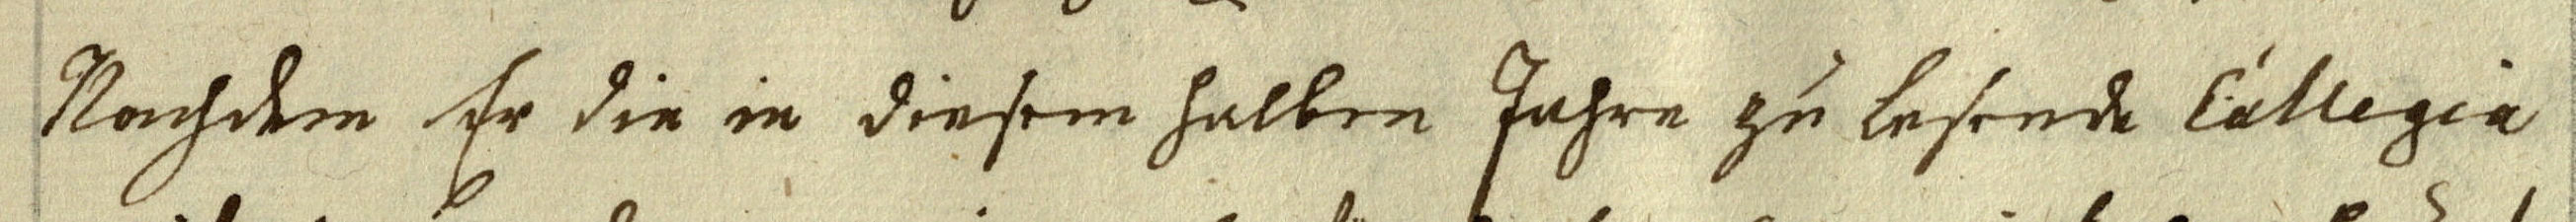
Nachdem er die in diesem halben Jahre zu lesende Collegia
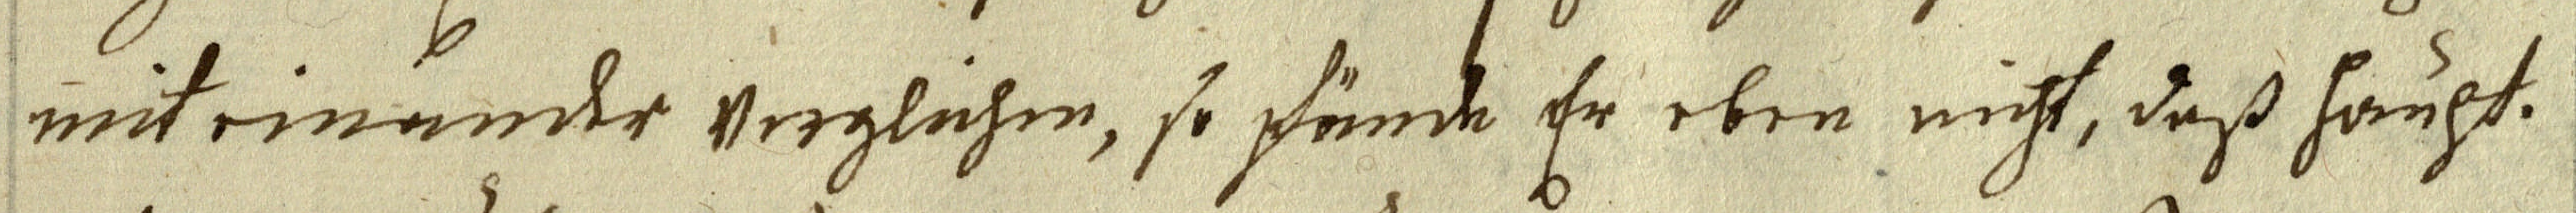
mit einander verglichen, so fände Er eben nicht, daß haupt¬
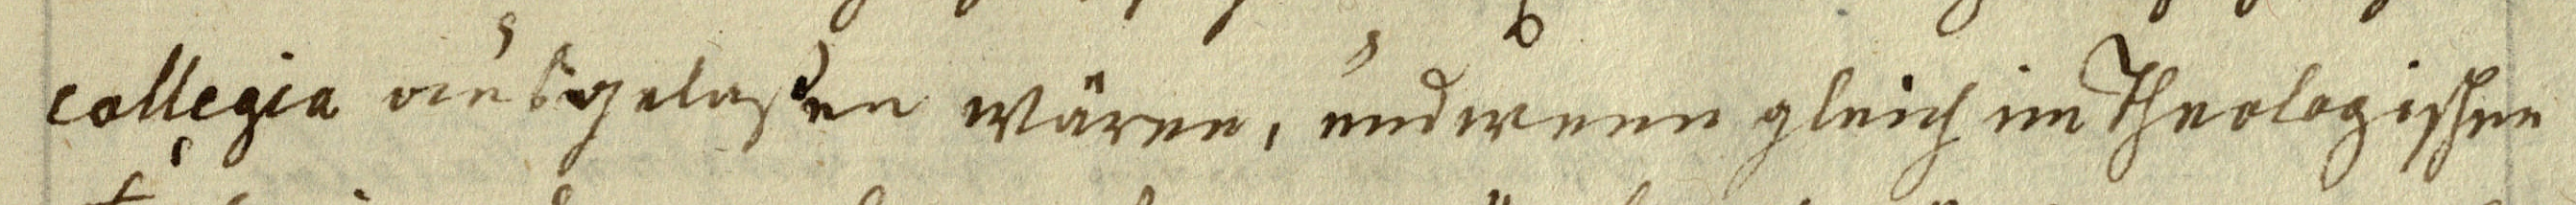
collegia ausgelaßen wären, und wenn gleich im Theologischen
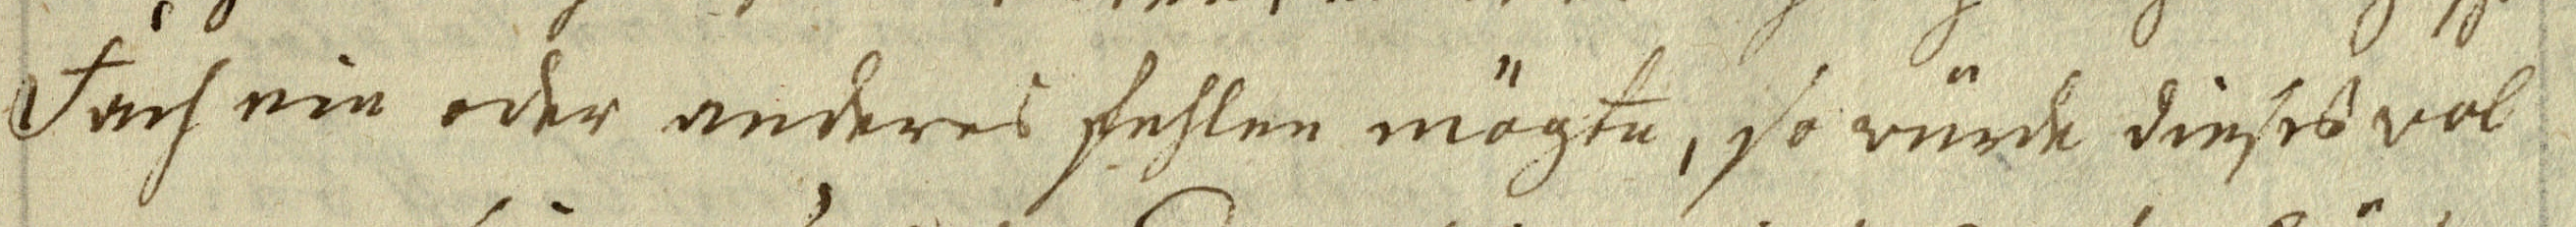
Fach ein oder anderes fehlen mögte, so würde dieses wol
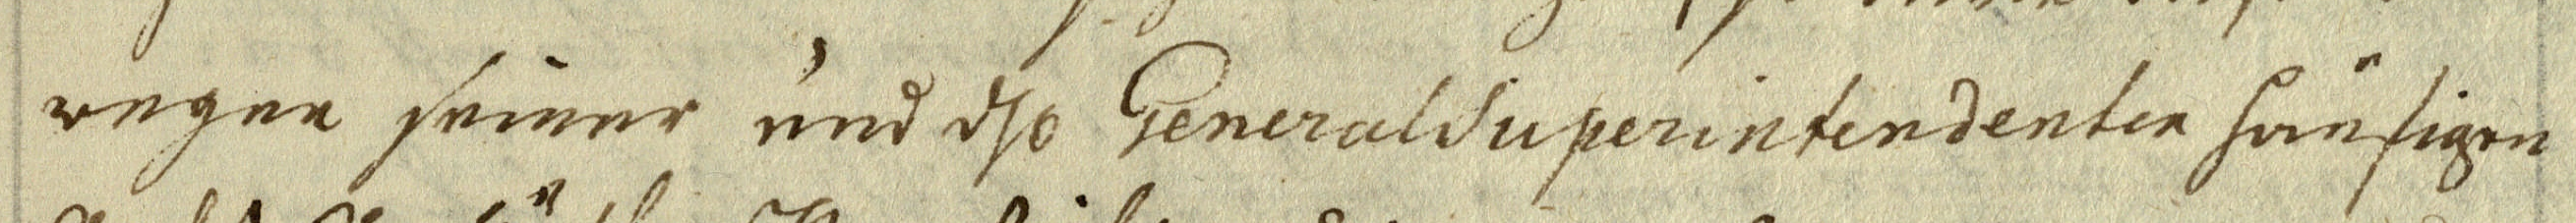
wegen seiner und dh GeneralSuperintendenten häufigen
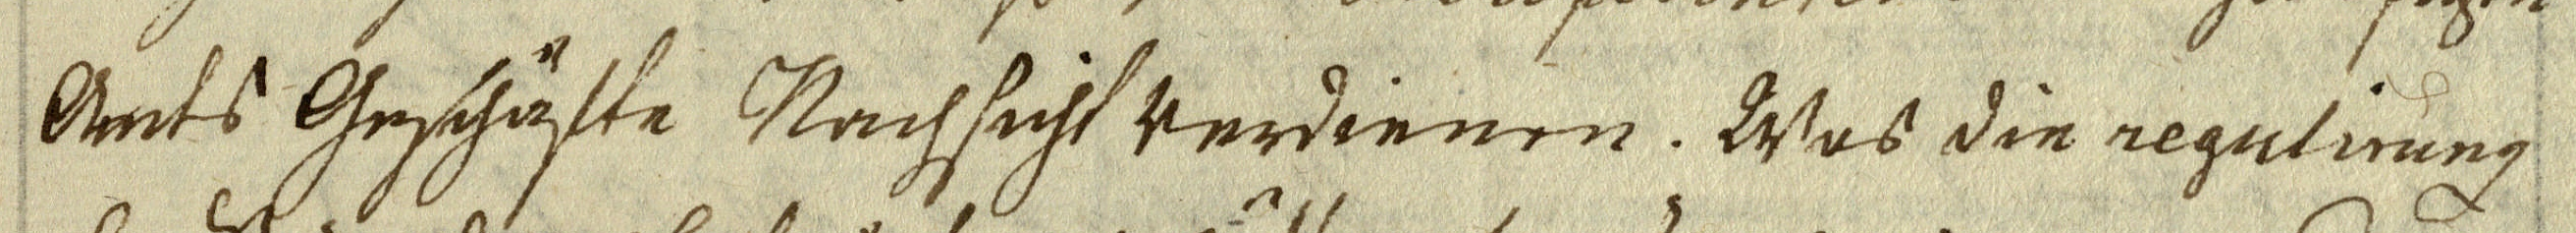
Amts Geschäfte Nachsicht verdienen. was die regulirung
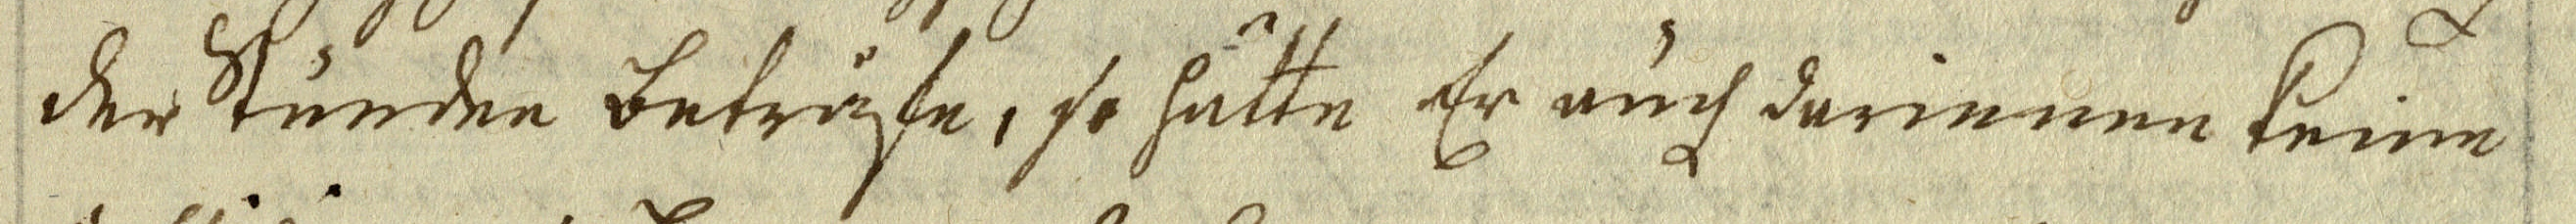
der Stunden beträfe, so hätte Er auch darinnen keine
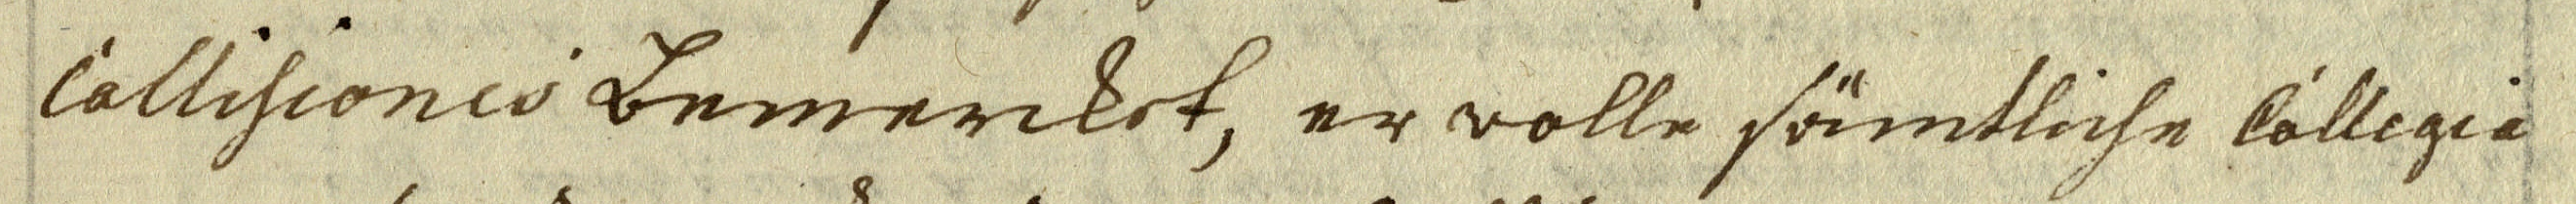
Collisiones bemercket, er wolle sämtliche Collegia
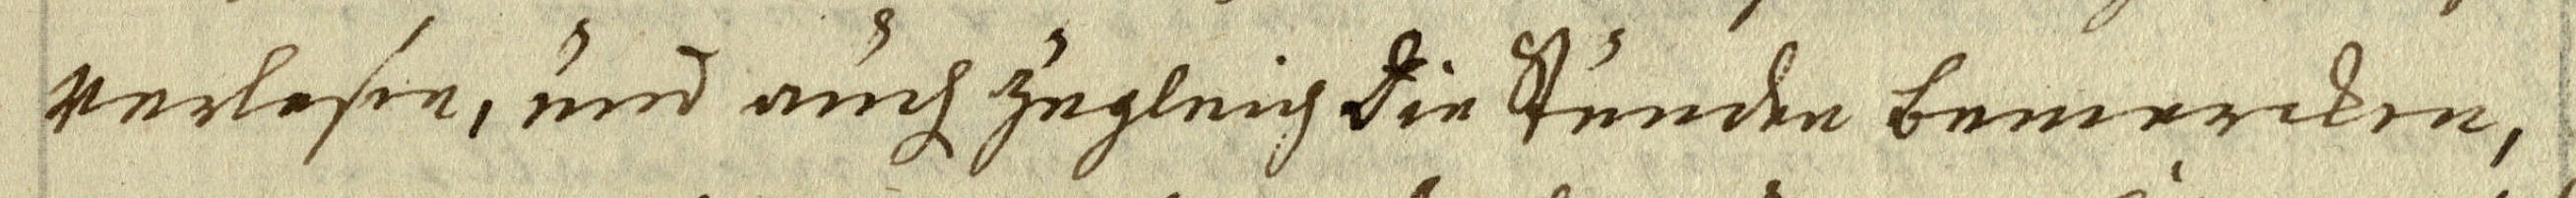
verlesen, und auch zugleich Die Stunden bemercken,
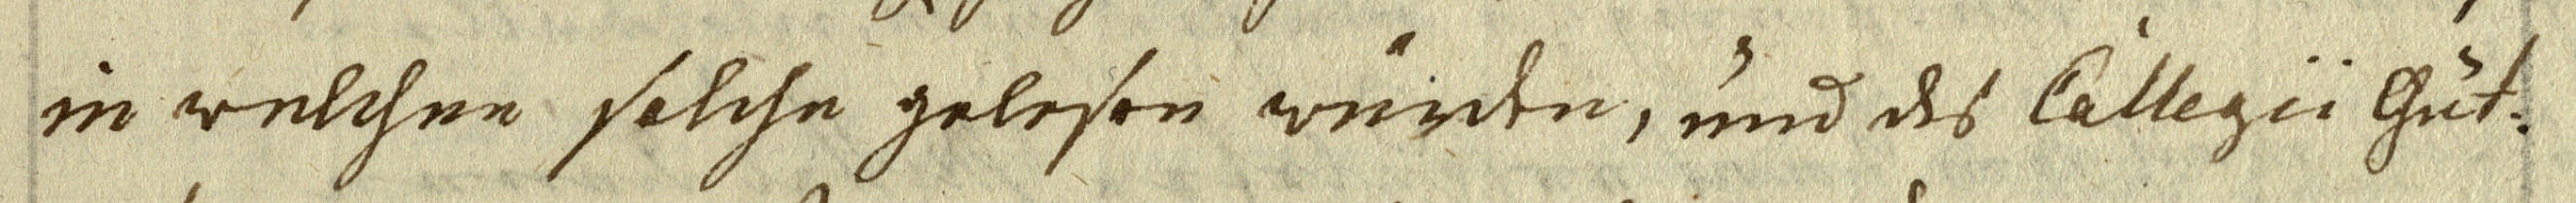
in welchen solche gelesen würden, und des Collegii Gut¬
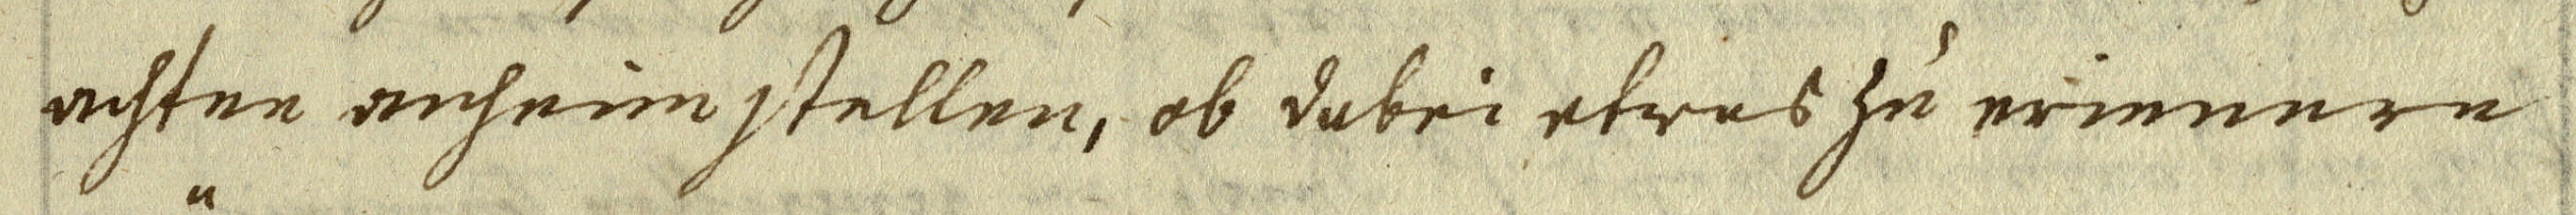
achten anheim stellen, ob dabei etwas zu erinnern
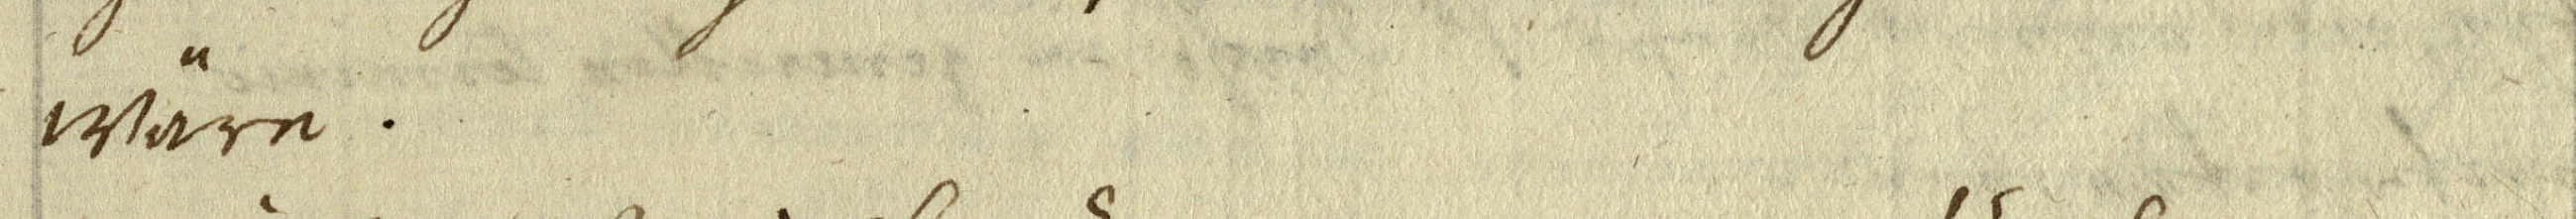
wäre.
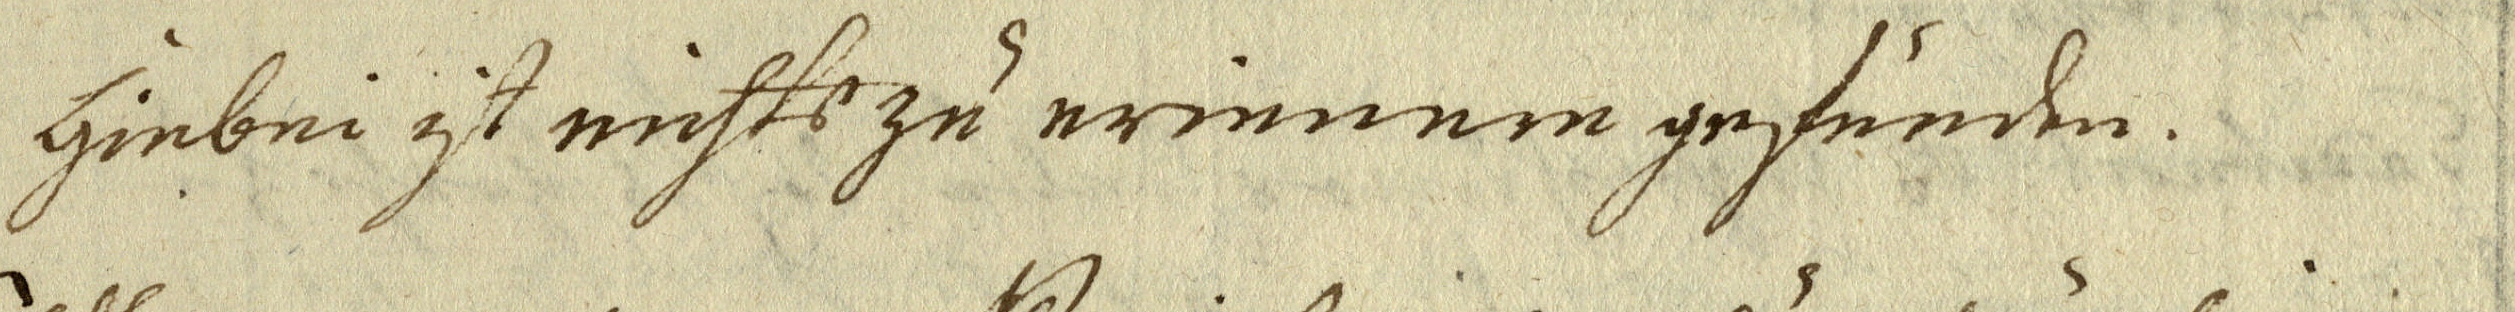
Hiebei ist nichts zu erinnern gefunden.
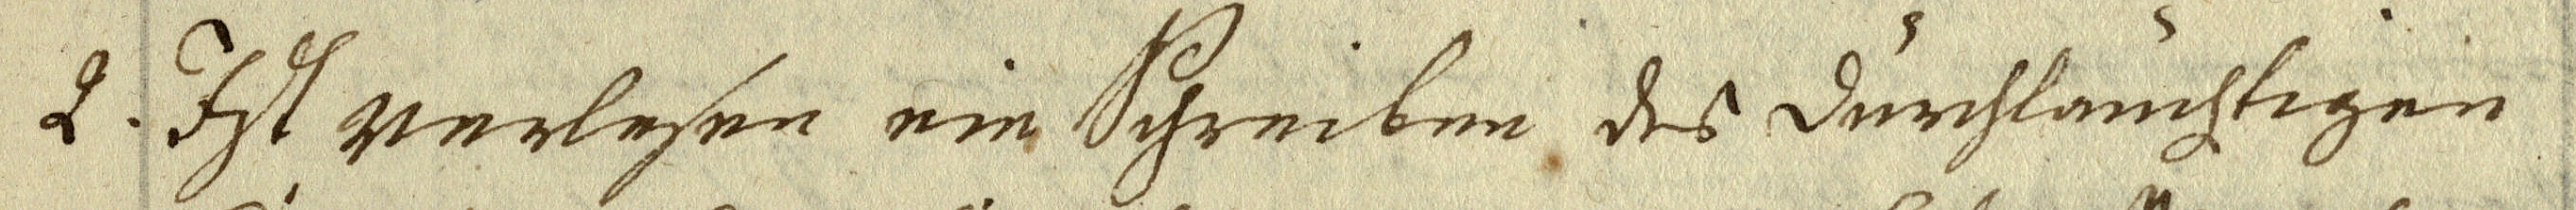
2. Ist verlesen ein Schreiben des Durchläuchtigen
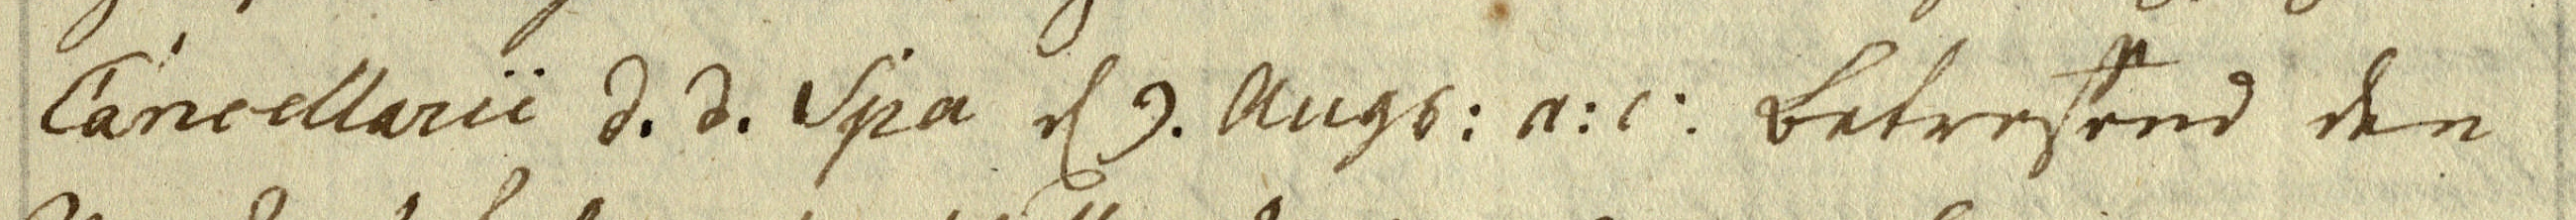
Cancellarii d. d. Spa d 9. Augs: a: c: betreffend den
